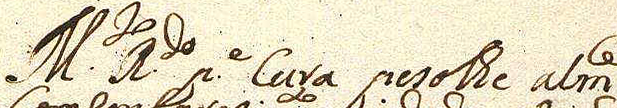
M.to R.do p.e Cura pesolhe a vmce
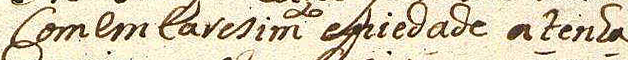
Com emCaresimto e piedade a tenha
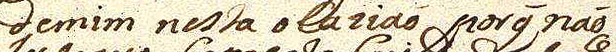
de mim nesta oCaziaõ porq̄ naõ
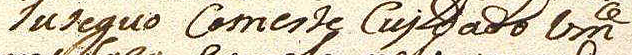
suseguo Com este Cujdado vmce
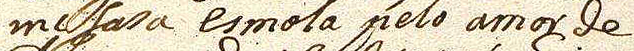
me fasa esmola pelo amor de
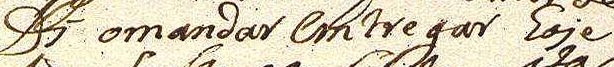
Ds̄ o mandar emtregar hoje
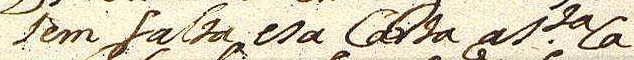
sem falta esa Carta a s.ta Ca
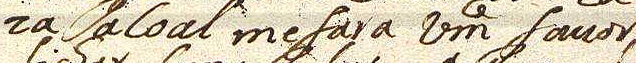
za a Coal me fara vmce fauor,
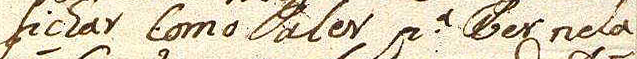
fichar Como a ler p.a ver nela
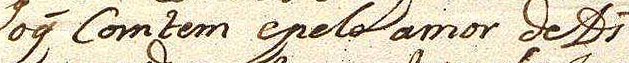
o q̄ Comtem e pelo amor de Ds̄
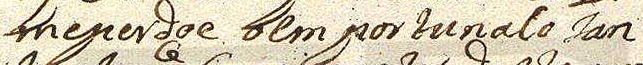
me perdoe o emportunalo tan
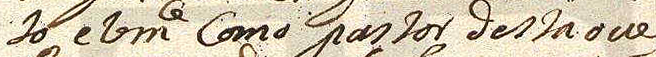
to e vmce Como pastor desta oue
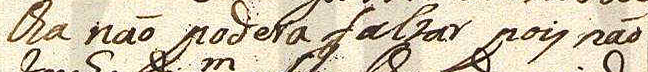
lha naõ podera faltar pois naõ
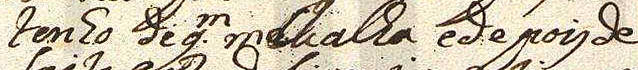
tenho de q.m me ualha e depois de
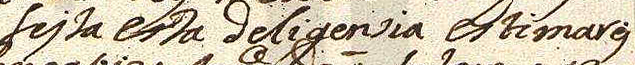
fejta esta deligensia estimarej
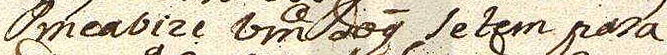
me avize vmce do q̄ se tem pasa
